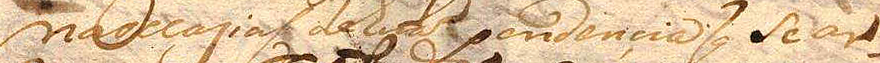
na occaziaõ de huā pendençia q̄ se ar
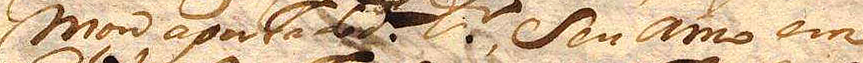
mou a porta do d.o s.or seu amo em
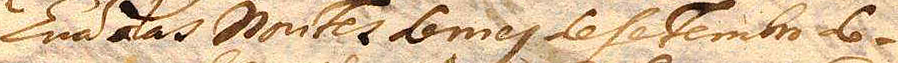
huā das noutes do mes de setembro do
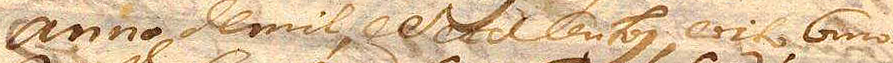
anno de mil, e setecentos, e oito, Como
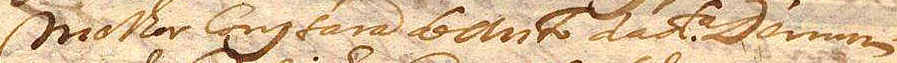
melhor Constara do auto da d̄.a Denun
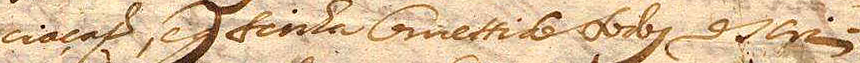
ciaçaõ, e q̄ tinha Comettido todos os cri
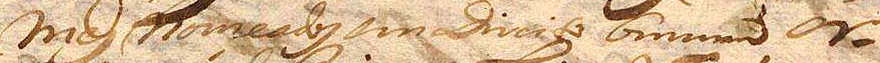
mes nomeados em direito comum or
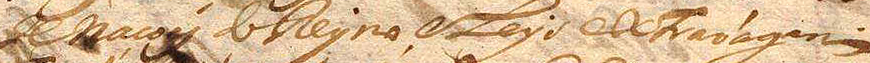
denaçoẽs do Reyno, e Leys extravagan
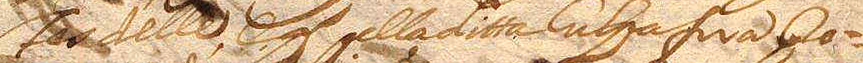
tes delle, e q̄ pella ditta Culpa fora pro
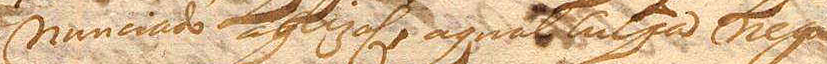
nunciado a prizaõ, a qual culpa nega
